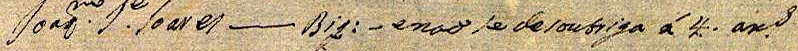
Ioaq.m I.e Soares - Big: - e naõ se desoubriga á 4 an.s
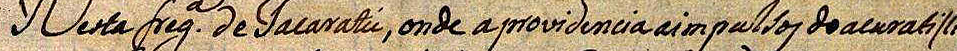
Nesta freg.a de Tacaratú, onde a providencia a impulsos do acuratissi
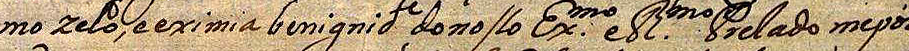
mo zelo, e eximia benignide do nosso Ex.mo e R.mo Prelado me pós
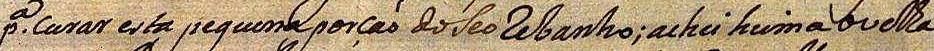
p.a curar esta pequena porçaõ do Seo Rebanho; achei huma ovelha
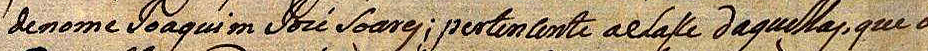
de nome Ioaquim Iozé Soares; pertencente a cLasse daquellas, que o
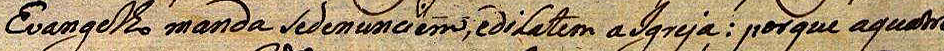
Evangelho manda se denunciem, e diLatem a Igreja: porque a quatro
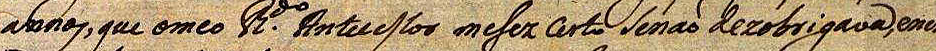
annos, que o meo R.do Antecessor me fez certo senaõ dezobrigava, e nem
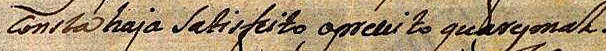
consta haja satisfeito o preceito quaresmaL.
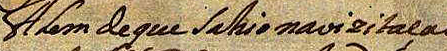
ALem de que sabia na vizitaçaõ
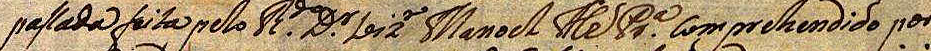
passada feita pelo R.do D.r Viz.r Manoel Me Pr.a comprehendido por
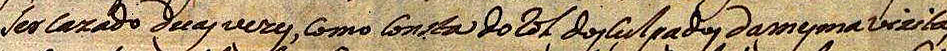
ser cazado duas vezes, como consta do Rol dos culpados da mesma vizita,
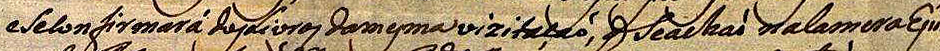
e se confirmará dos Livros da mesma vizitaçaõ, q̄ Seachaõ na Camera Epis
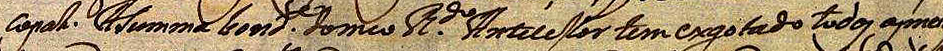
copaL. A Summa bond.e do meo R.do Antecessor tem exgotado todos os meios
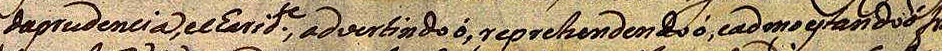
da prudencia, e charid.e, advertindo ó, reprehendendo ó, e admoestandoó fra
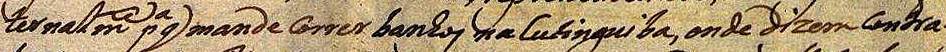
ternaLmte pa q̄ mande correr banhos na Cutinguiba, onde dizem contra
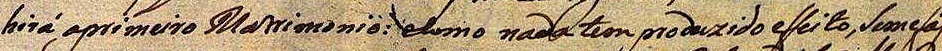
hirá o primeiro Matrimonio: e como nada tem produzido effeito, semefás
